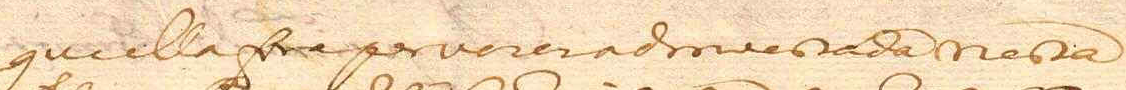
que ella fora por vezes admoestada nesta
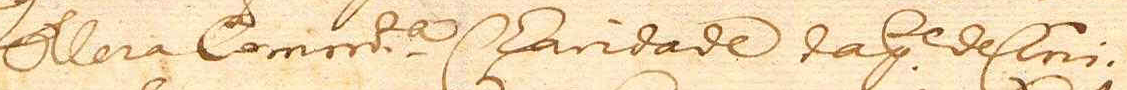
Meza Com m.ta Charidade da p.te de Chris
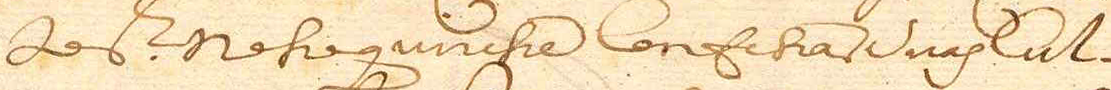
to s.or nosso quizesse Confessar suas cul
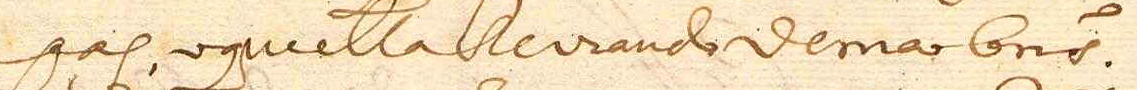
pas, o que ella Re uzando de mao Cons.o
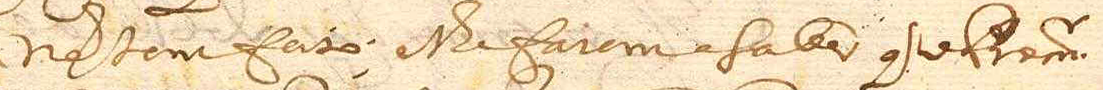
naõ tem feito; e lhe fazem a saber q̄ o Prom.or
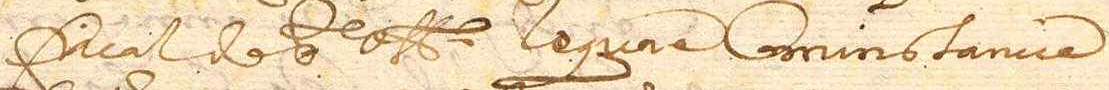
fiscal do s.to off.o Requere Com instancia
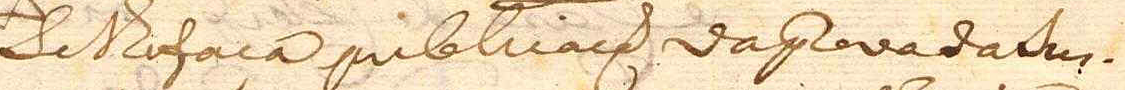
Selhe faça publicaçaõ da pRova da Ius
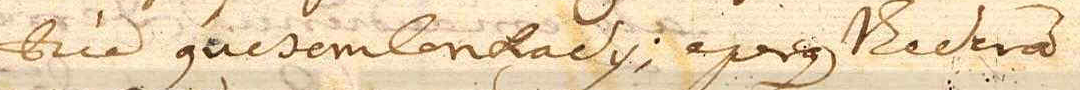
tiça que tem Contra sy; e porq̄ lhe será
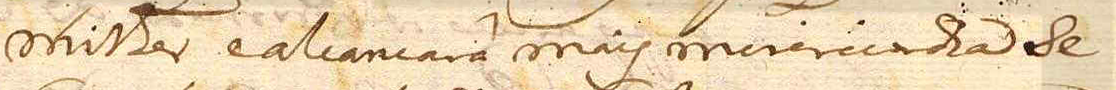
milhor, e alcançará mais misericordia se
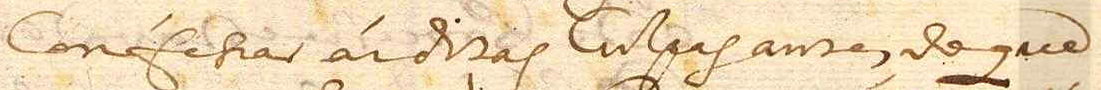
Confessar as ditas Culpas antes do que
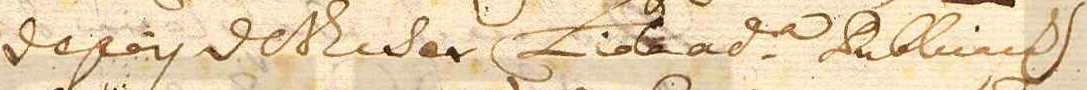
depois de lhe ser Lida a d.a Publicaçaõ
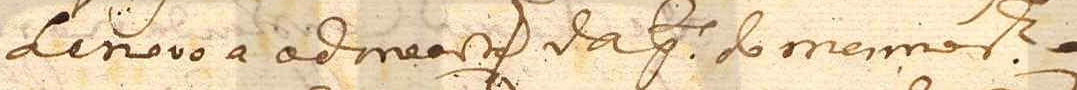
de novo a ademoestaõ da p.te do mesmo s.or
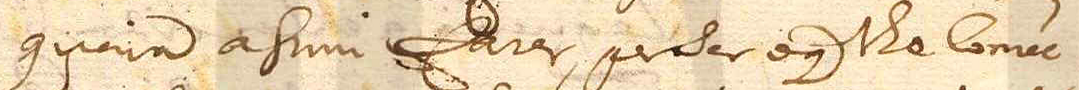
queira assim fazer, por ser o q̄ lhe Convē
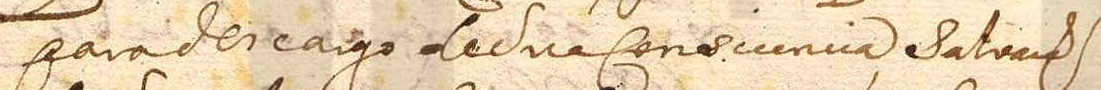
para descargo de Sua Consciencia, Salvaçaõ
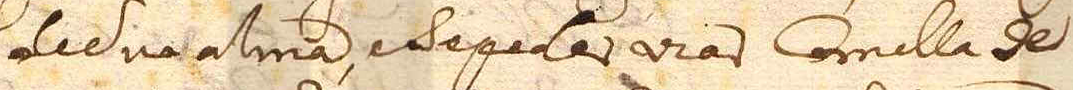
de Sua alma, e se poder vzar Com ella de
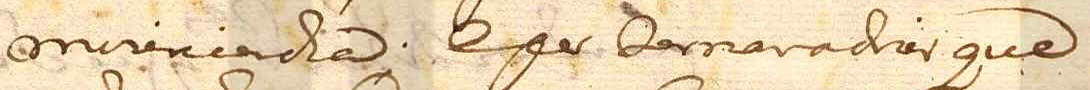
mizericordia; E por tornar a dizer que
